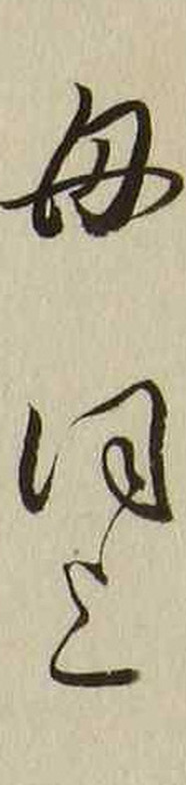母同上
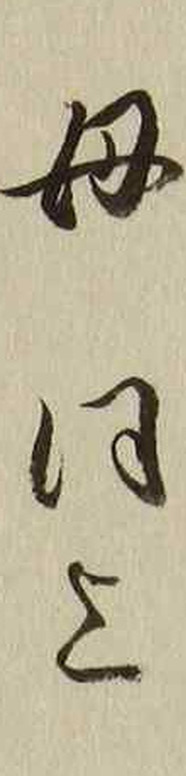母同上
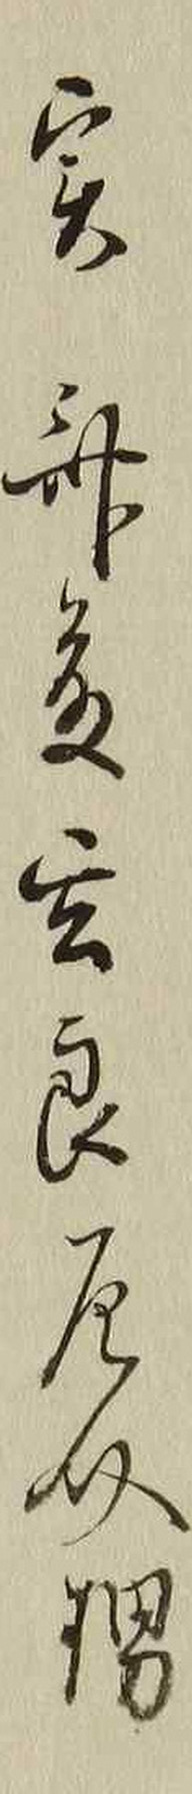実斎藤玄良厄介甥
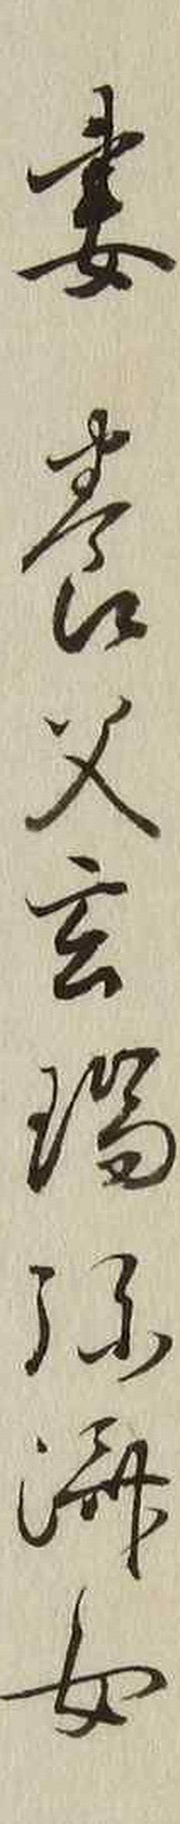妻養父玄瑞弥済女
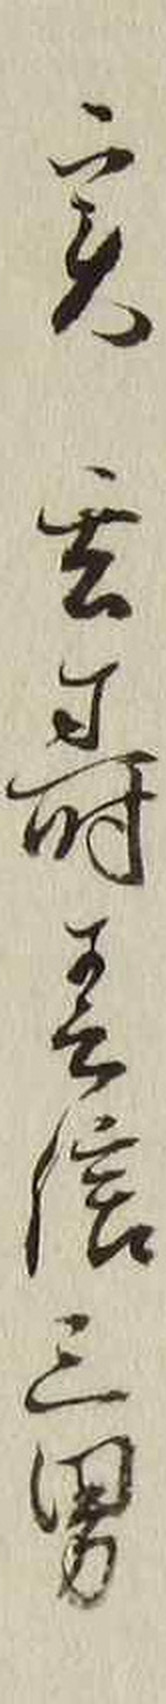実玄寿春信三男
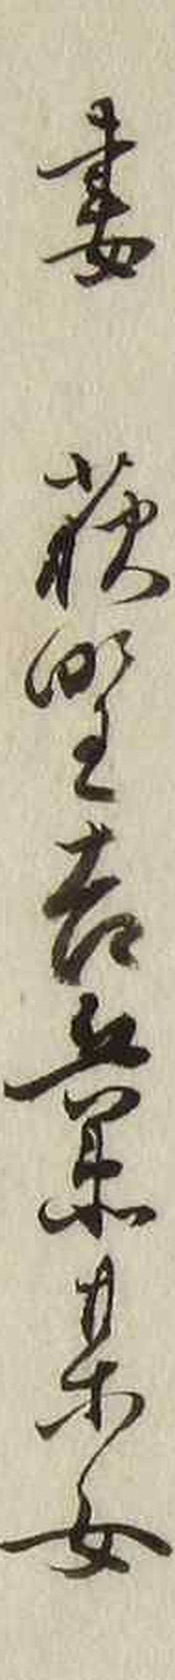妻萩野吉兵衛女
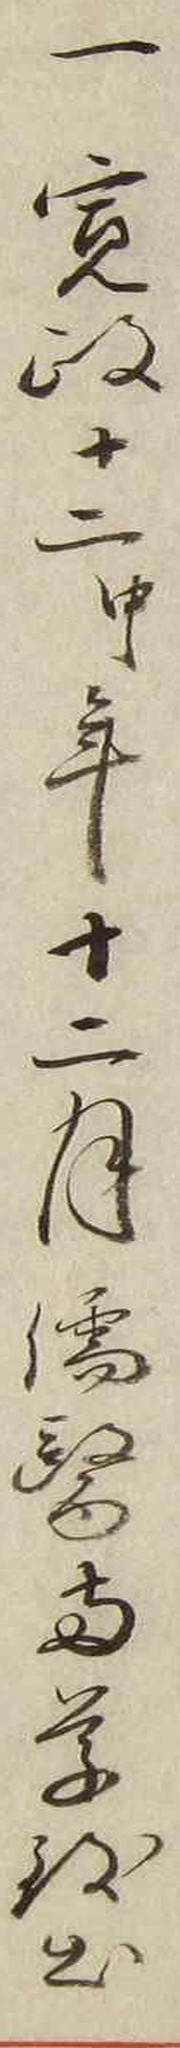一寛政十二申年十二月儒医両学致出

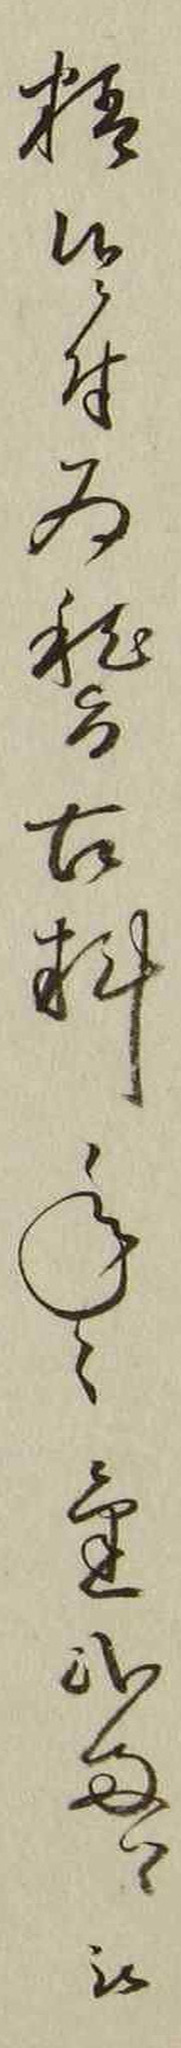精候ニ付為稽古料年々金弐両ツヽ被
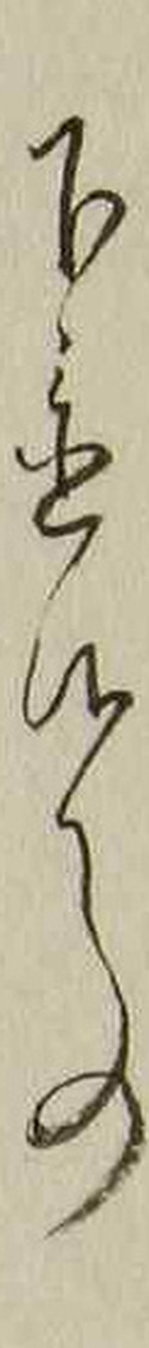下置候事
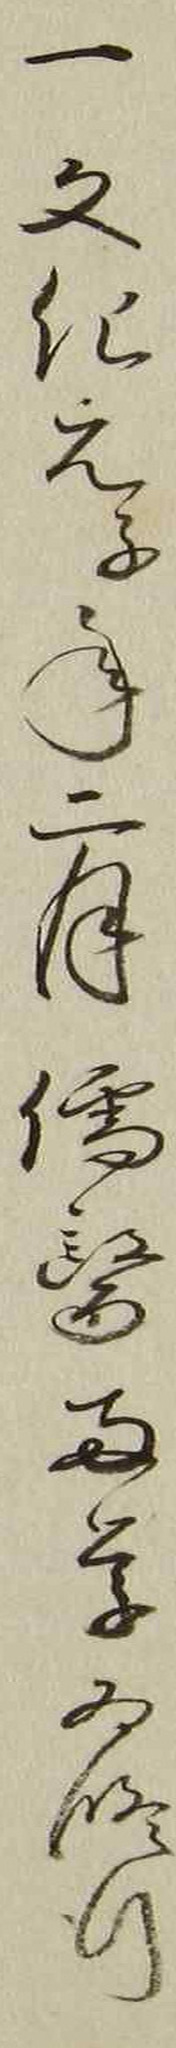一文化元子年二月儒医両学為修行
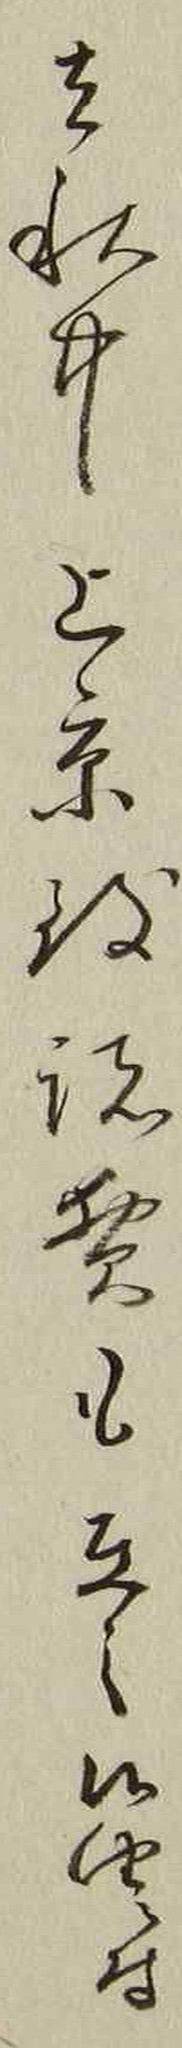去秋中上京致諸費も在之候由ニ付
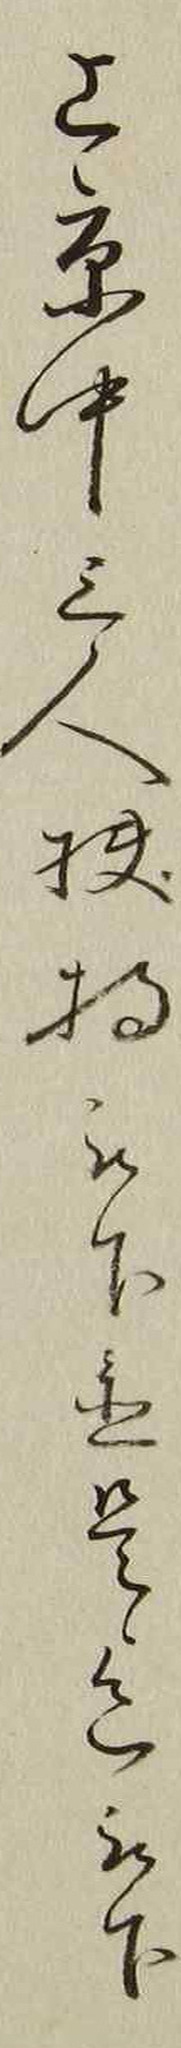上京中三人扶持被下置是迄被下
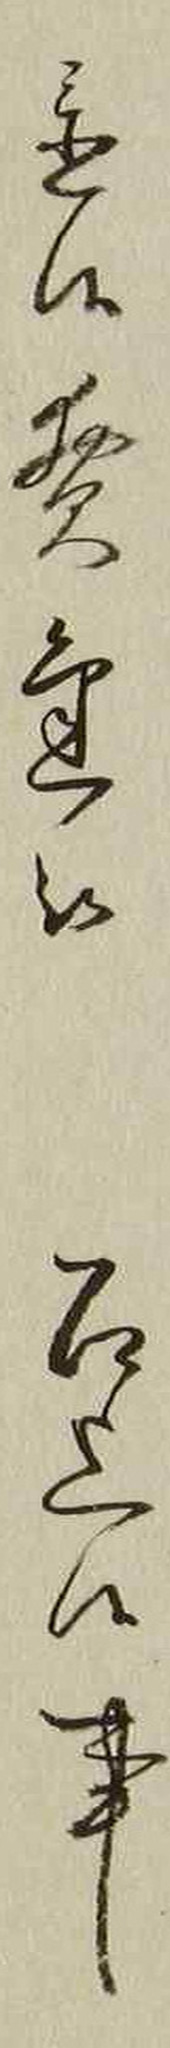置候費金被召上候事
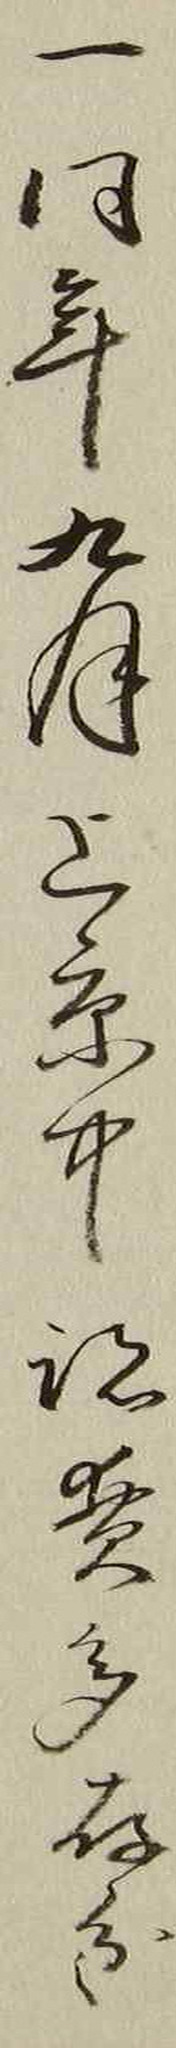一同年九月上京中諸費多存分之
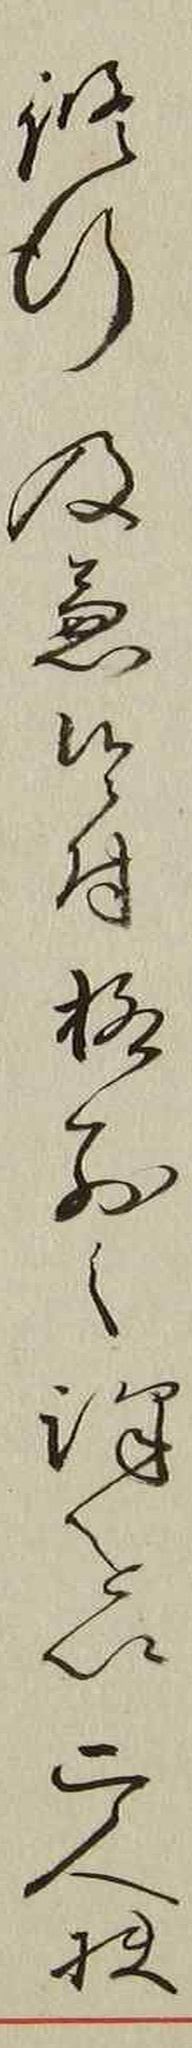修行及兼候ニ付格別之訳を以弐人
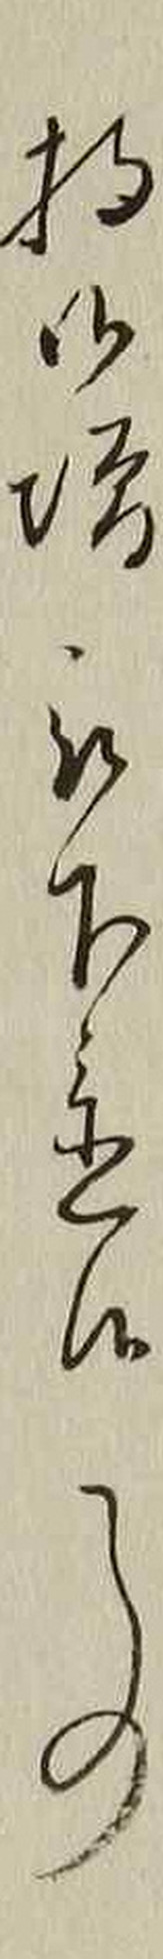扶持御増被下置候事
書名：諸士系譜　巻之8　い之部8
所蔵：会津若松市立会津図書館
